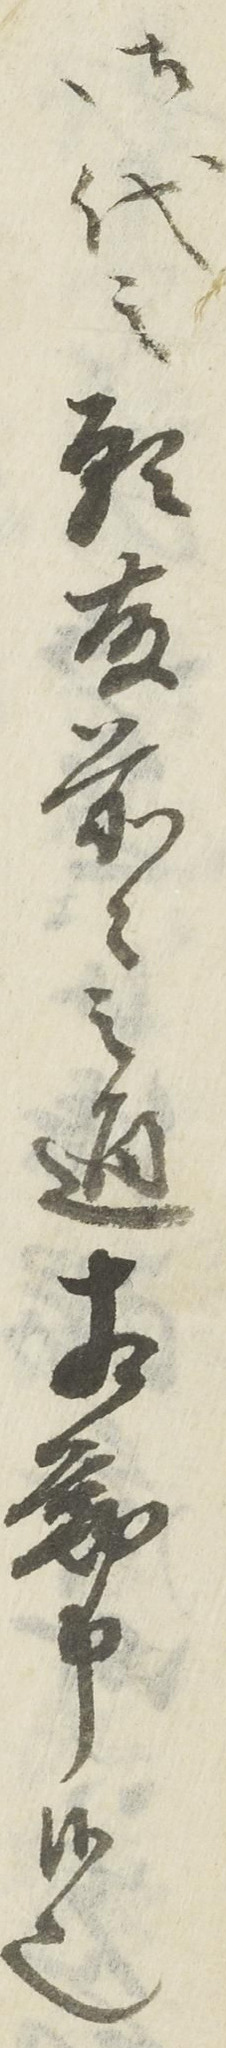御代之願故前々之通相勤申候也
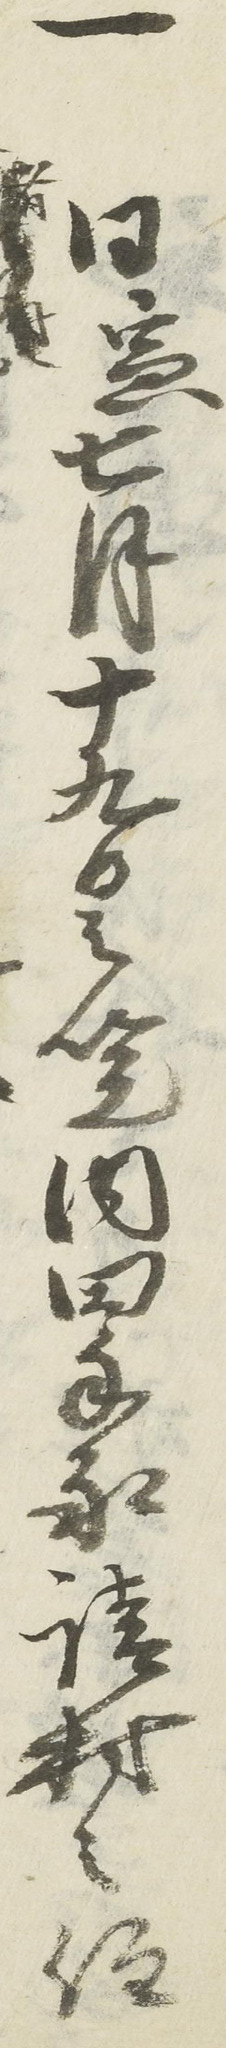一同寅七月十九日之晩内田手永請村之住
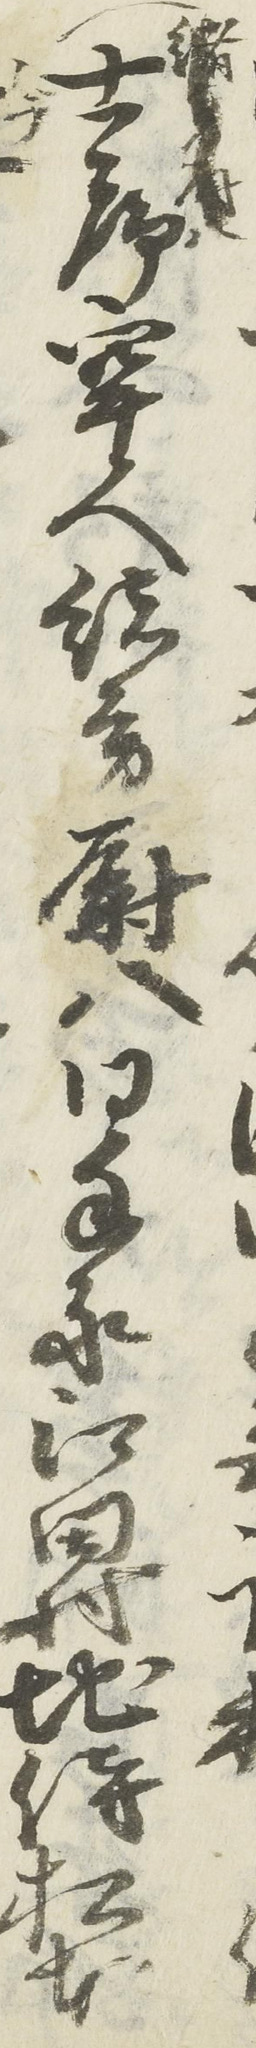士郎牢人緒方厨八同手永江田村地侍松本
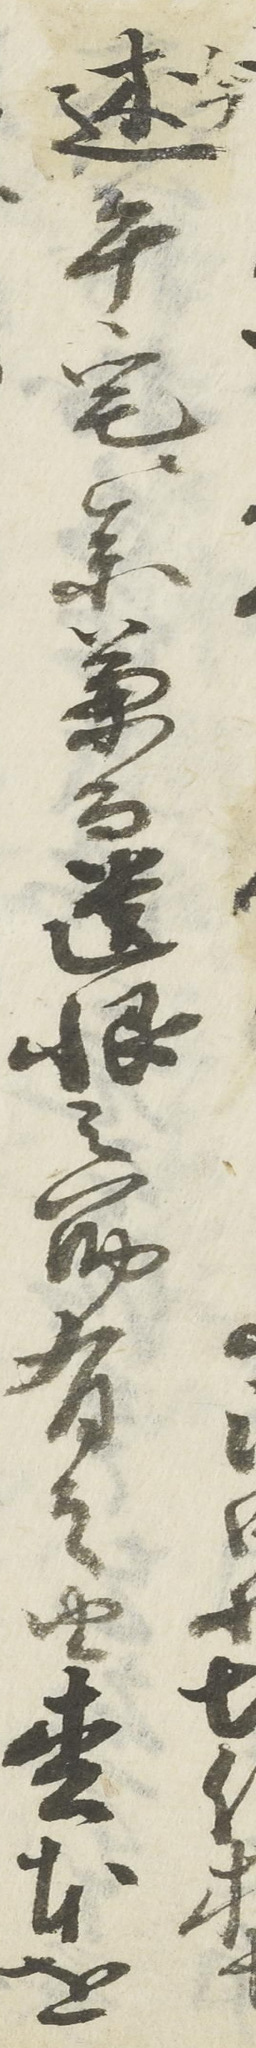述平宅ニ参兼而遺恨之筋有之由松本を
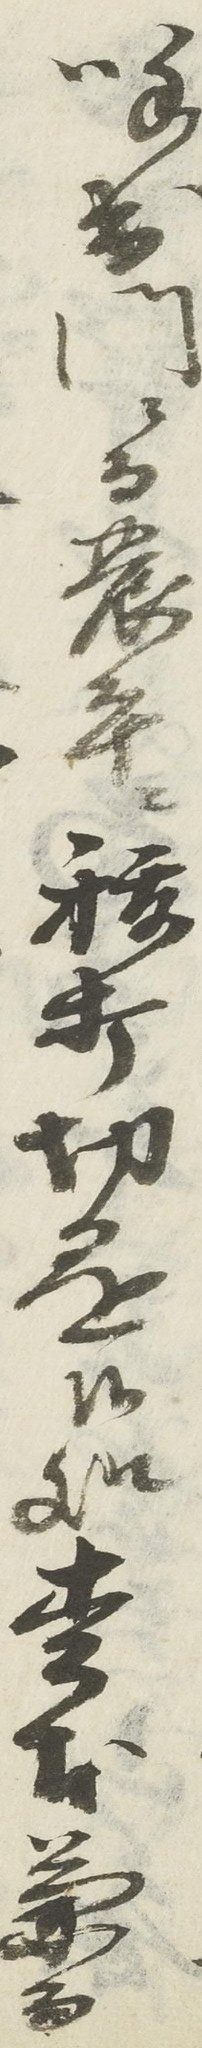呼出門ニ而農平ニ抜打切懸候処松本兼而
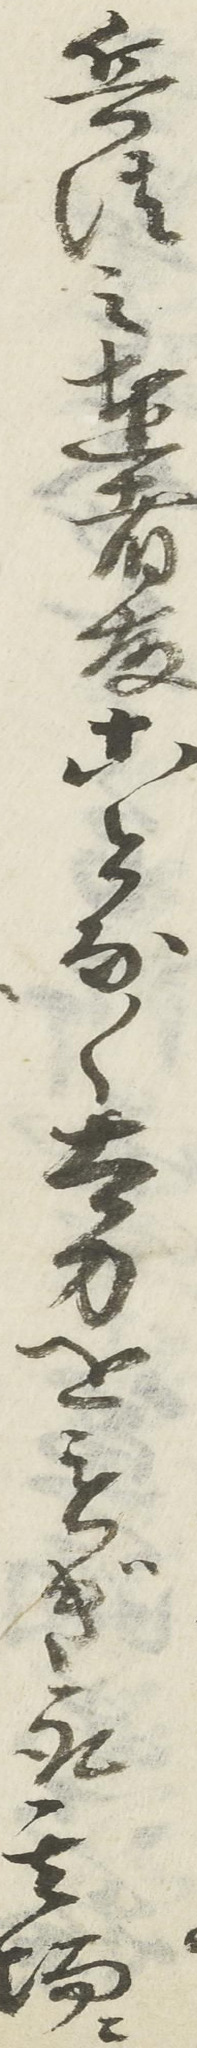兵法之達者故ことなく太刀をもぎ取其場ニ
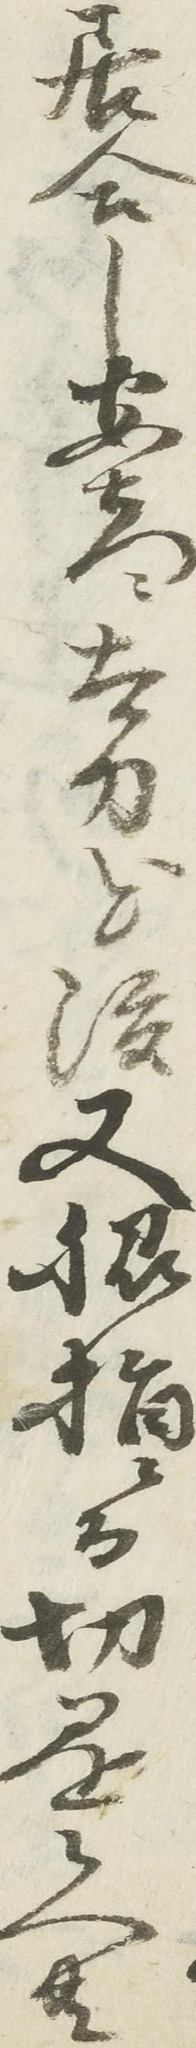居合し安右衛門ニ太刀を渡又脇指ニ而切懸候へ共
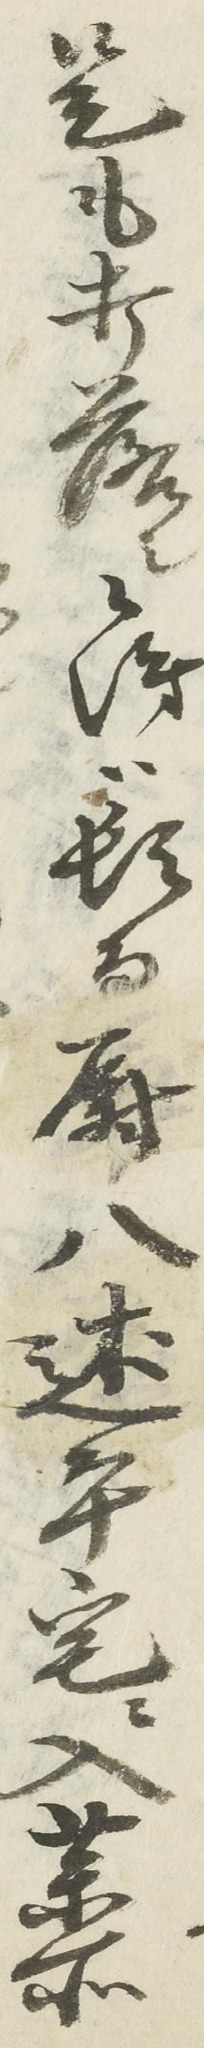是も打落シ候得は髟而厨八述平宅ニ入菜所
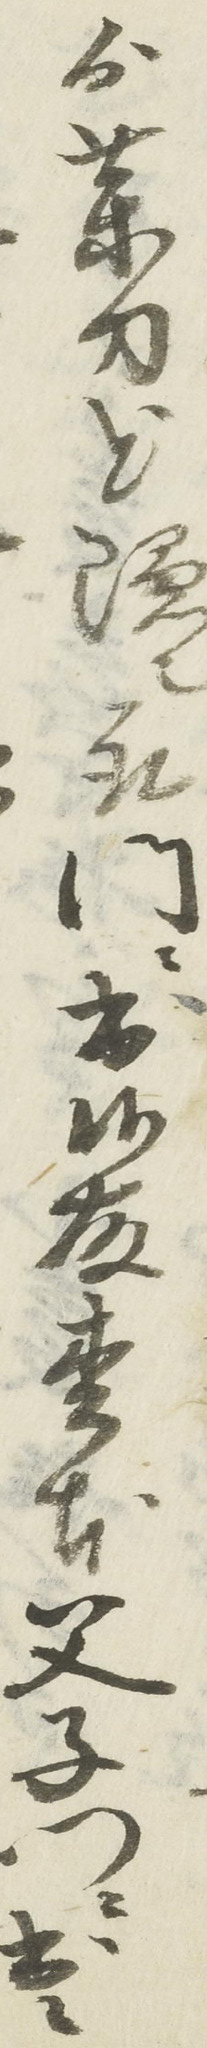ゟ菜刀を隠シ取門ニ出候故松本父子門ニ出て
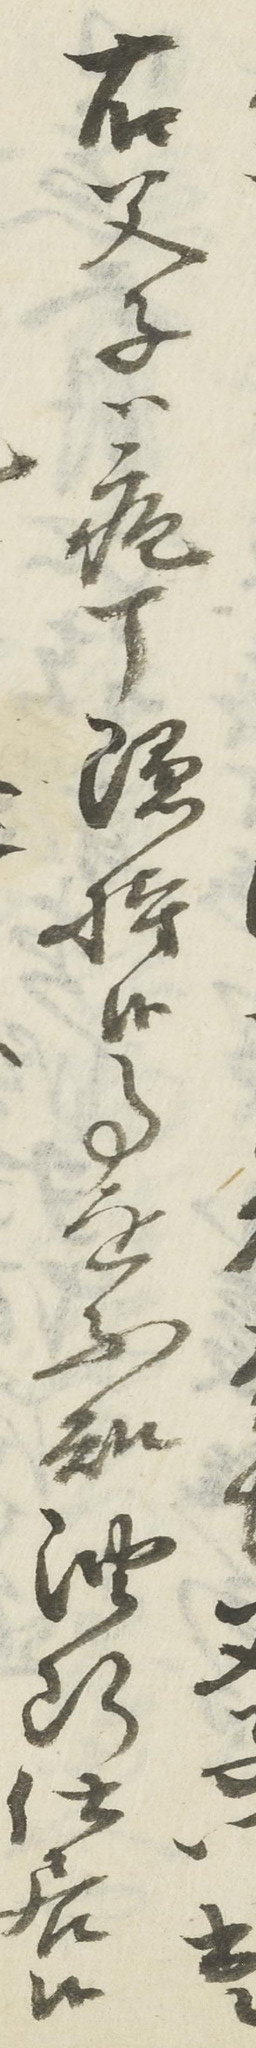右父子は包丁隠持候事を不知油断仕居候
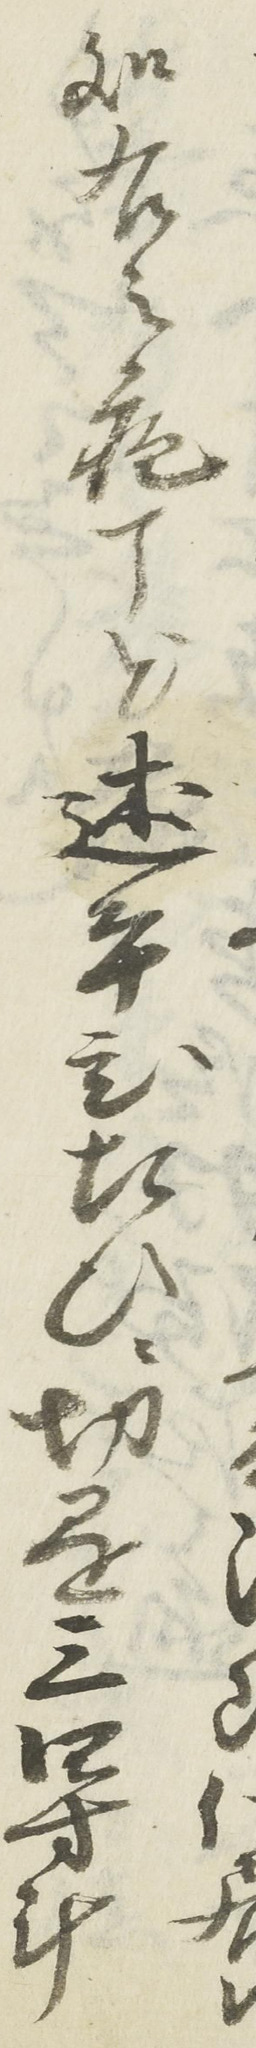処右之庖丁を述平ひたひニ切懸三四寸計
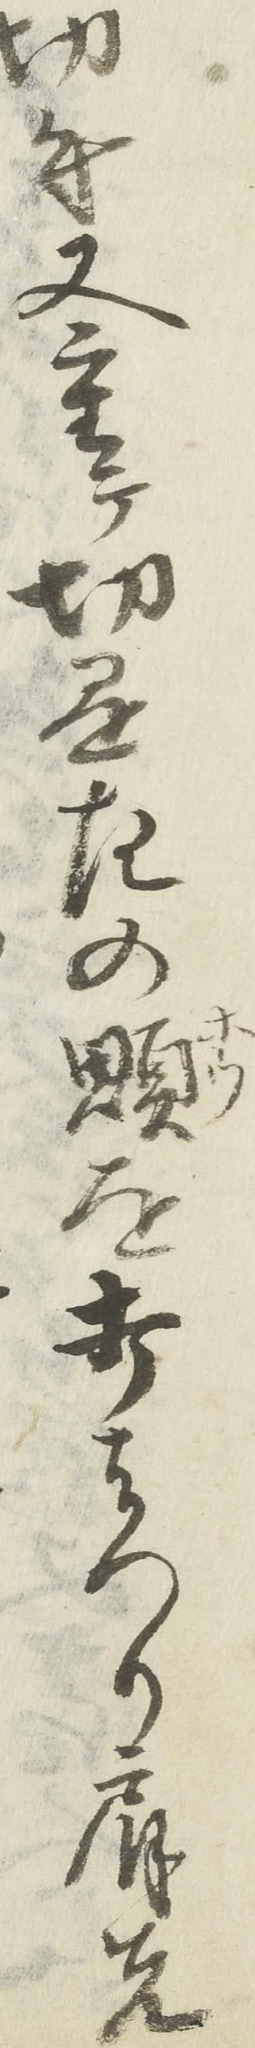切付又重テ切懸左の頬を打はつり肩先
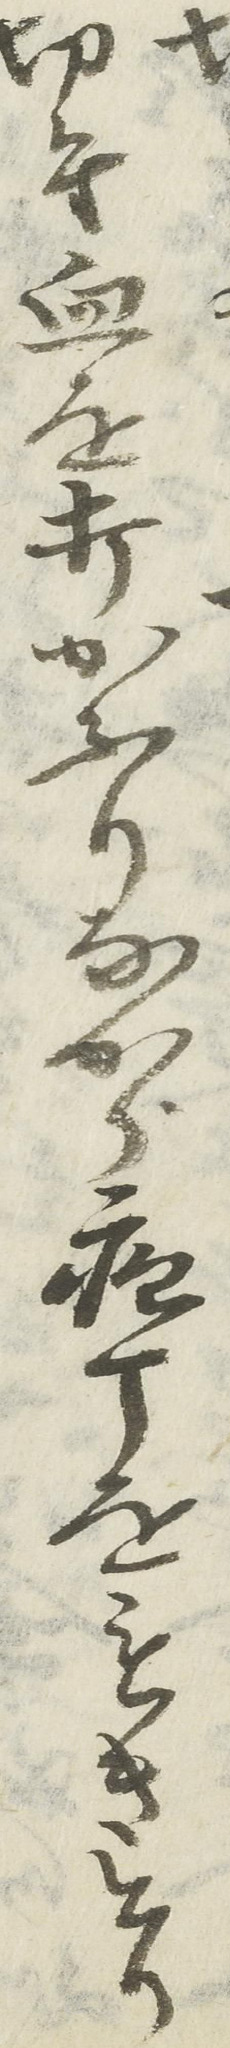切付血を打かふりなから庖丁をひきとり
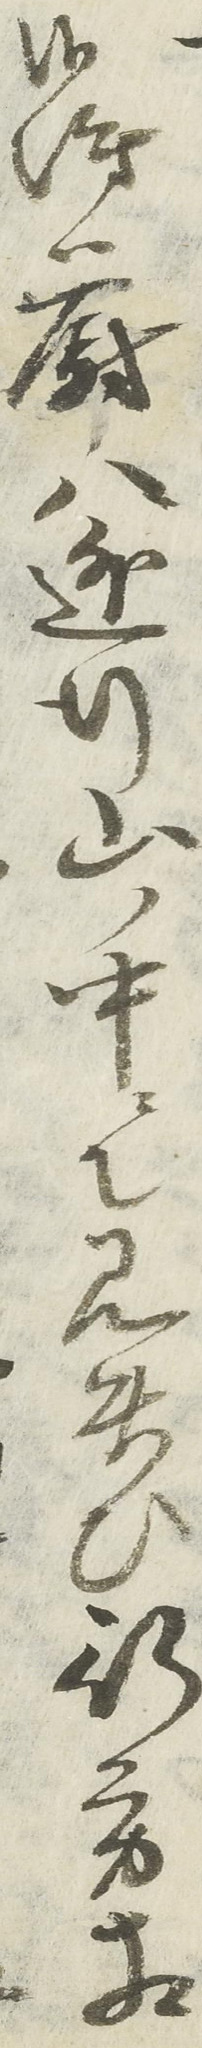候得は厨八逃行山ノ中ニて見失ひ行方相
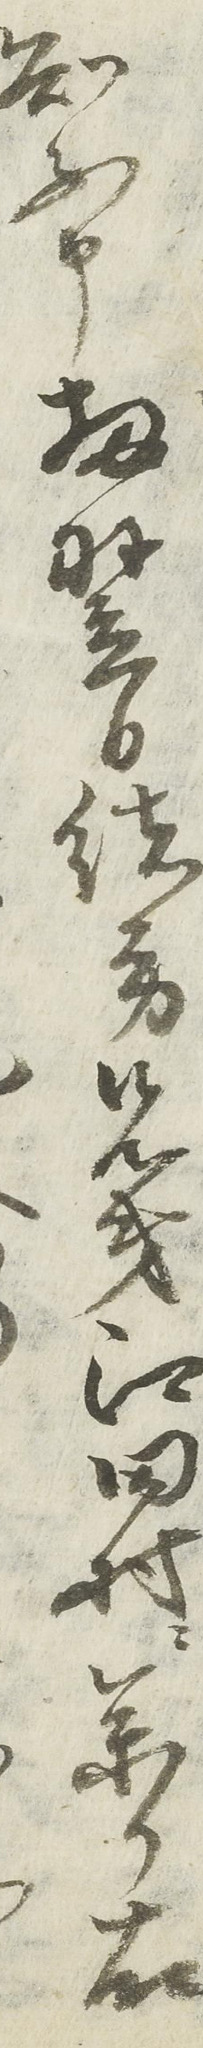知不申扨翌日諸方兄弟江田村ニ参り右
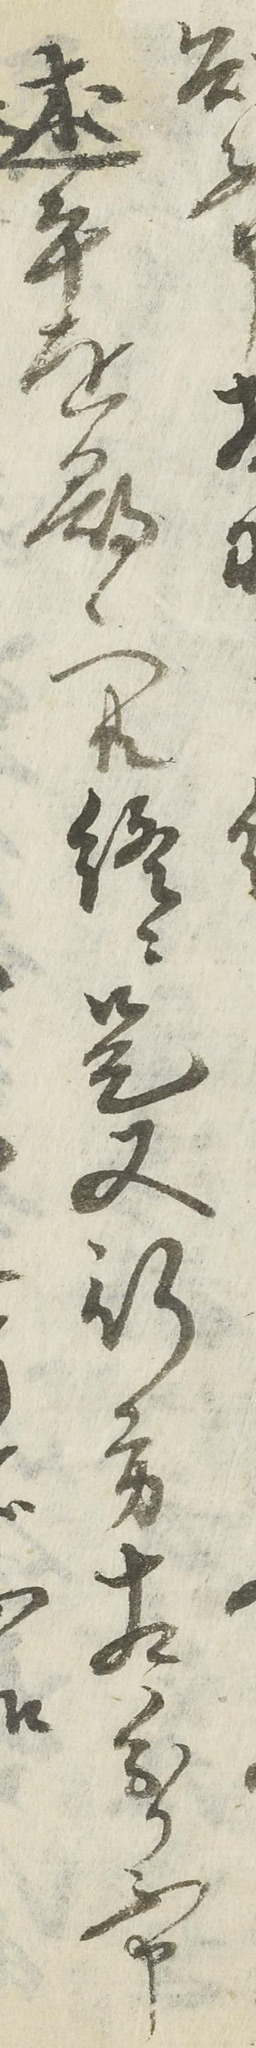述平を尋候へ共終に是又行方相分り不申
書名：後見笑
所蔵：東京大学地震研究所図書室 Earthquake Research Institute Library, The University of Tokyo, JAPAN
